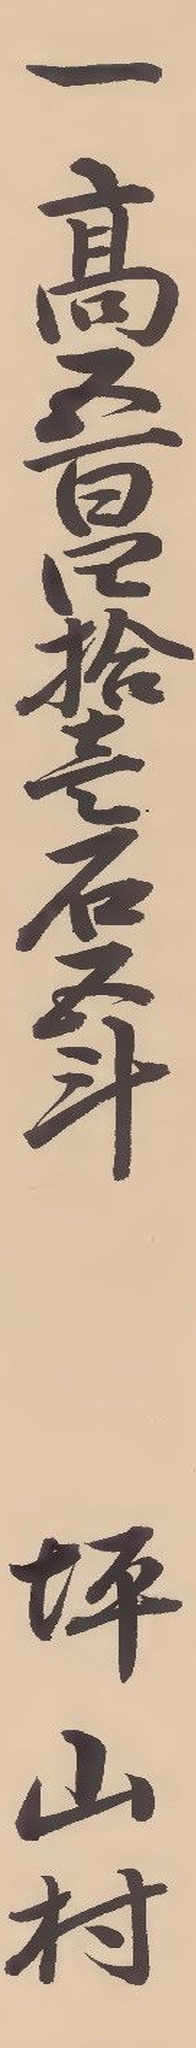一高五百四拾壱石五斗坪山村
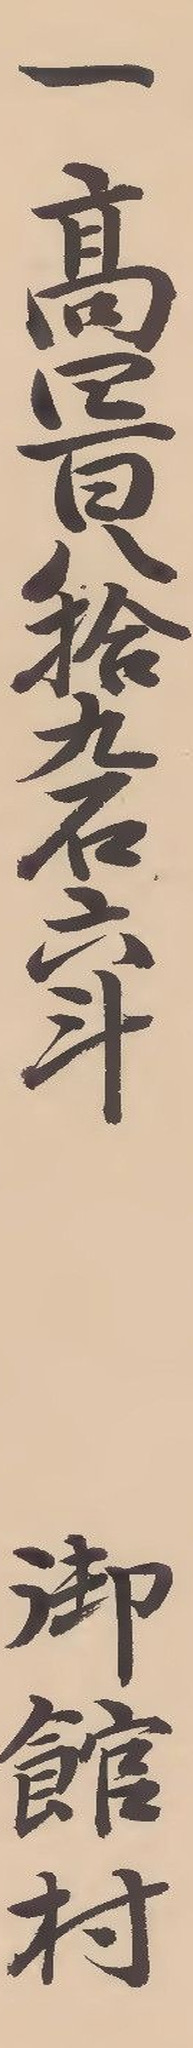一高四百八拾九石六斗御館村
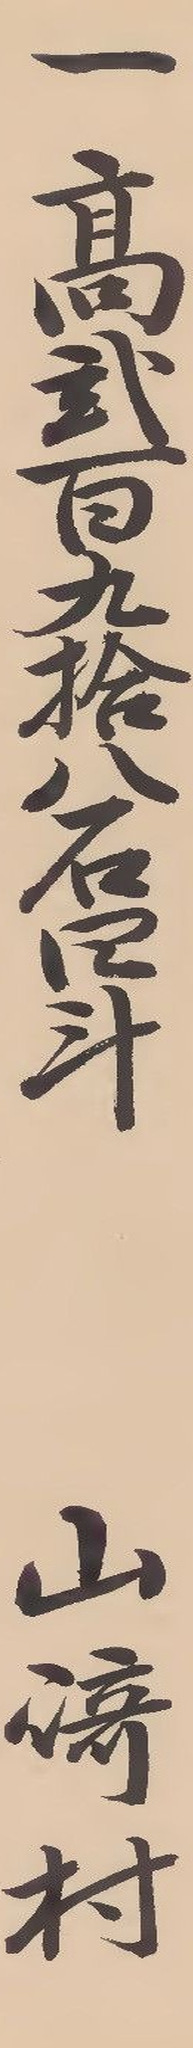一高弐百九拾八石四斗山崎村
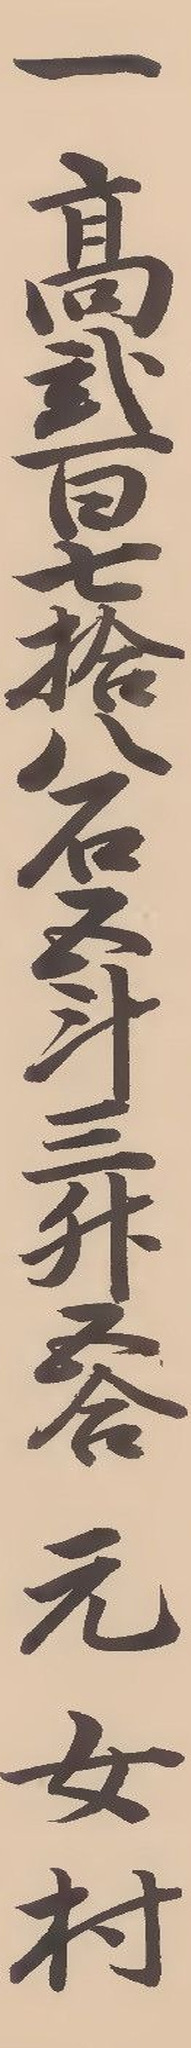一高弐百七拾八石五斗三升五合元女村
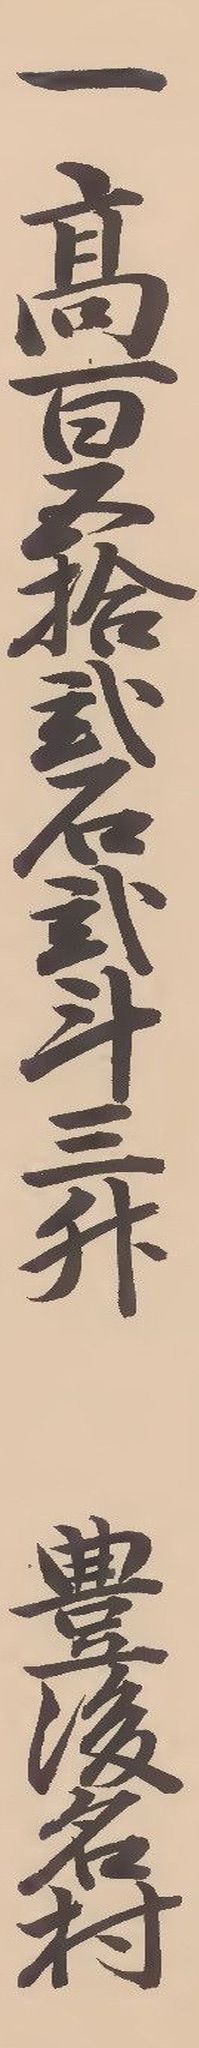一高百五拾弐石弐斗三升豊後名村
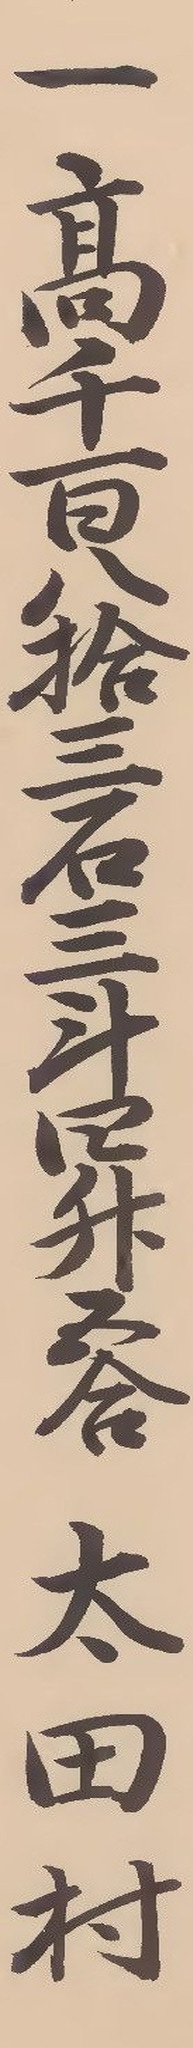一高千百八拾三石三斗四升五合太田村

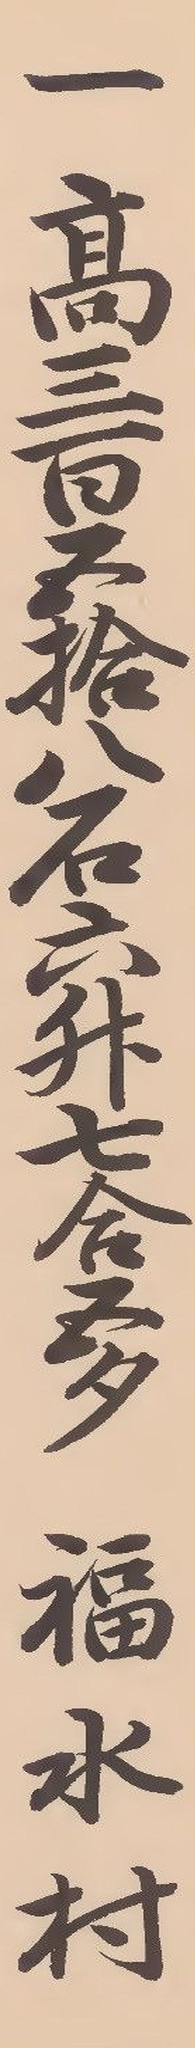一高三百五拾八石六升七合五勺福水村
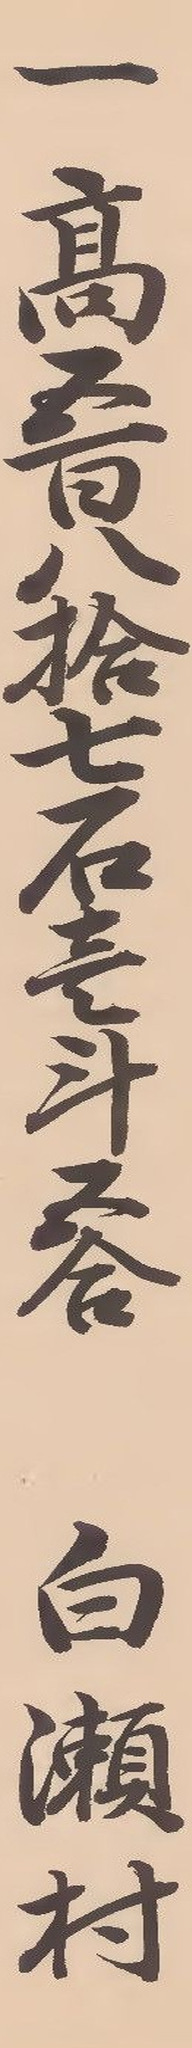一高五百八拾七石壱斗五合白瀬村
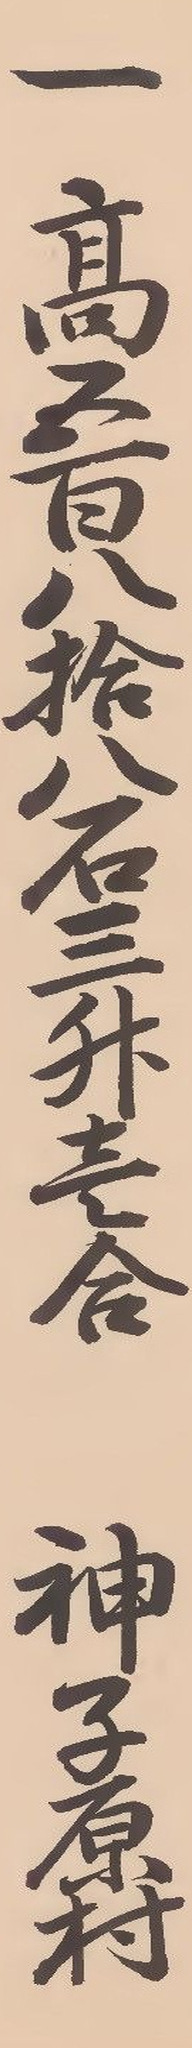一高五百八拾八石三升壱合神子原村
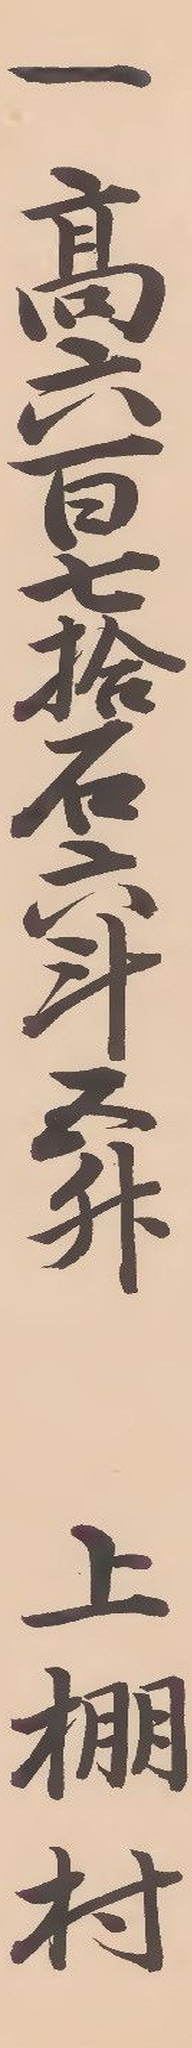一高六百七拾石六斗五升上棚村
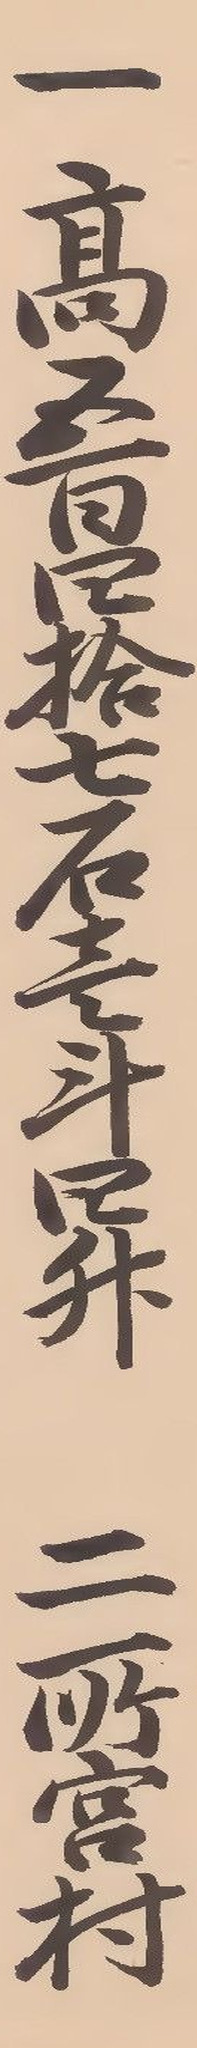一高五百四拾七石壱斗四升二所宮村
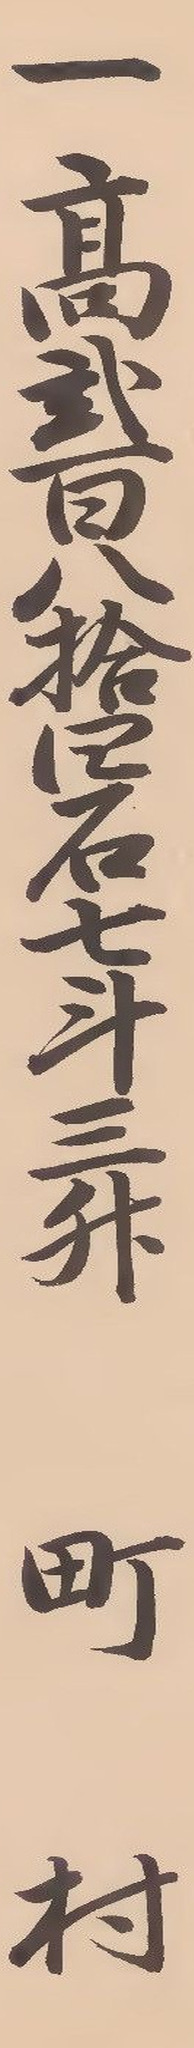一高弐百八拾四石七斗三升町村
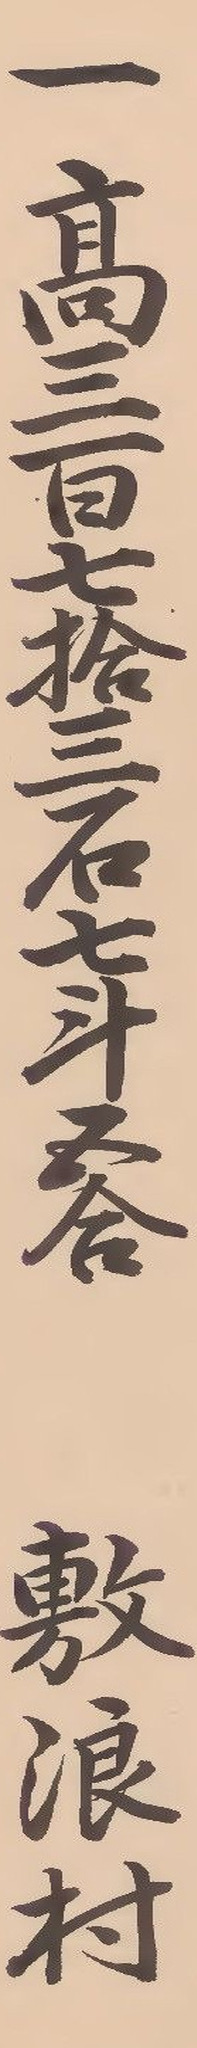一高三百七拾三石七斗五合敷浪村

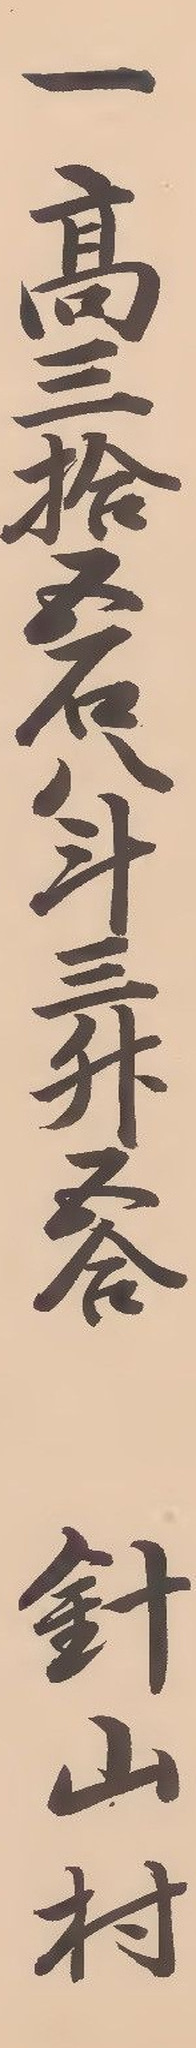一高三拾五石八斗三升五合針山村
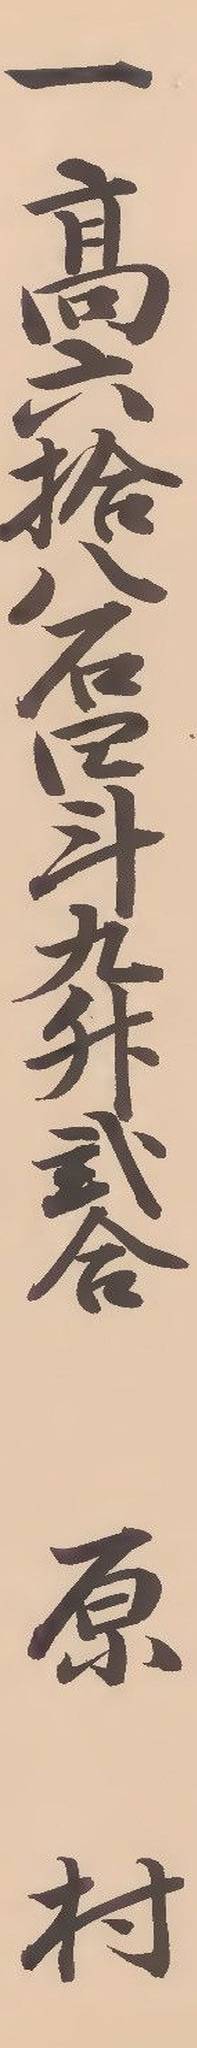一高六拾八石四斗九升弐合原村
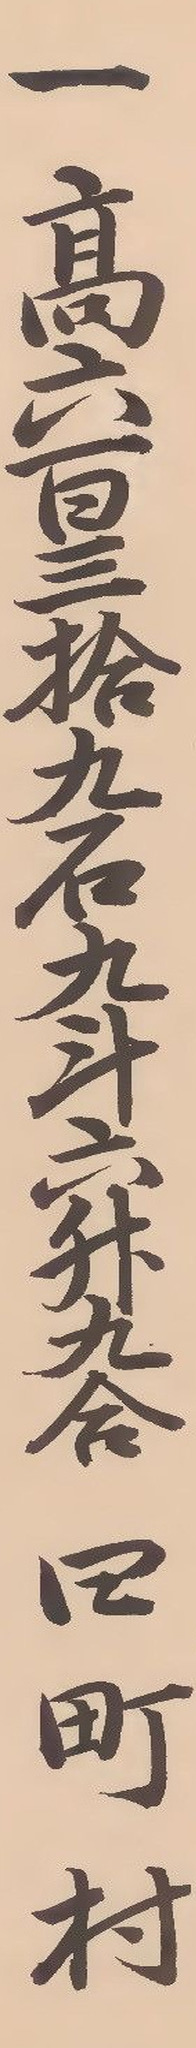一高六百三拾九石九斗六升九合四町村
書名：能登国郷帳
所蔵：国立公文書館 National Archives of Japan
